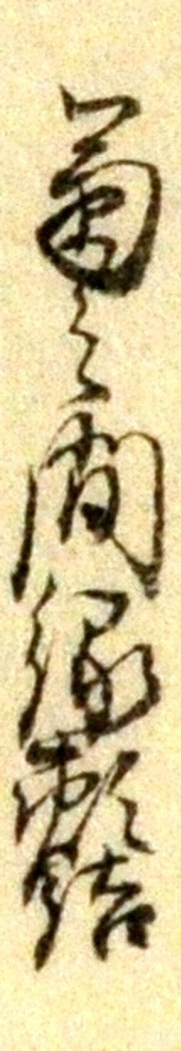菊之間縁頬詰
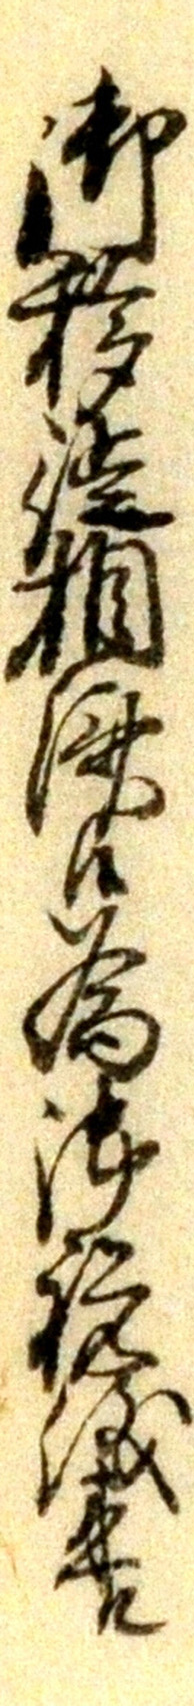御移徙相済候為御祝儀来ル
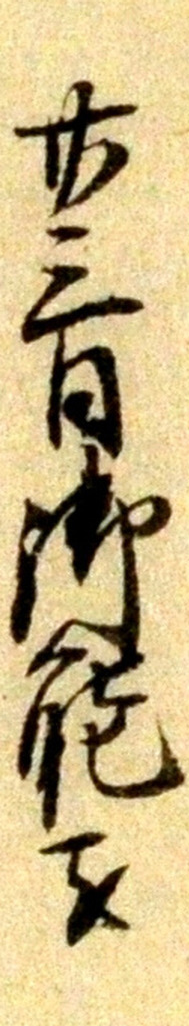廿三日御能被
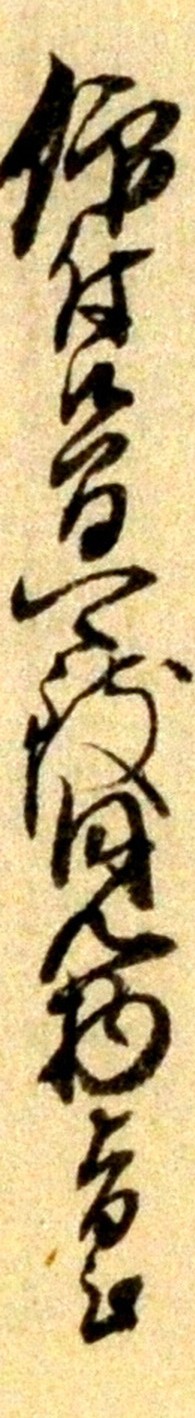仰付候間可致見物旨被
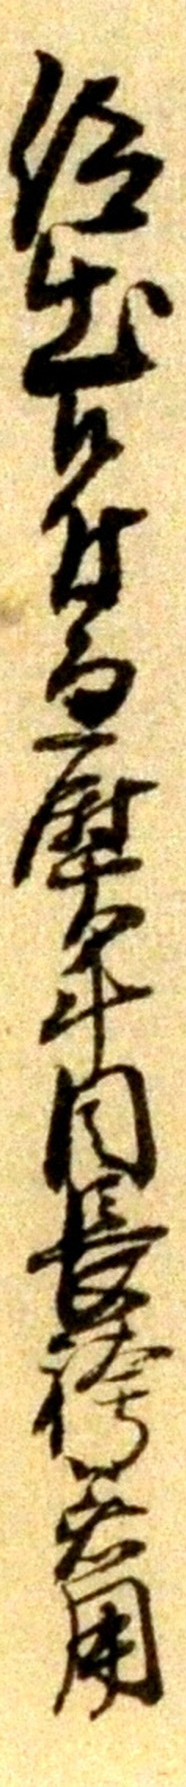仰出候付而熨斗目長袴着用
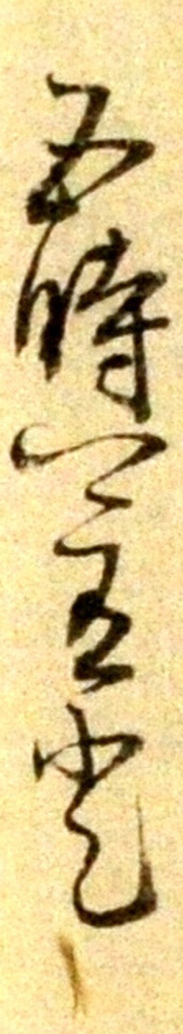五時可有登
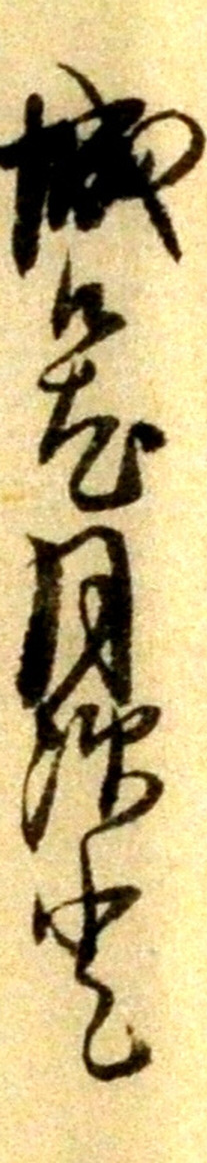城候尤月次登
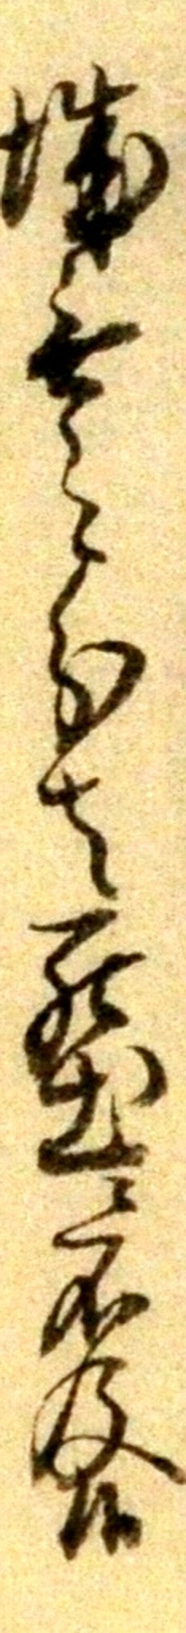城無之分は罷出ニ不及候
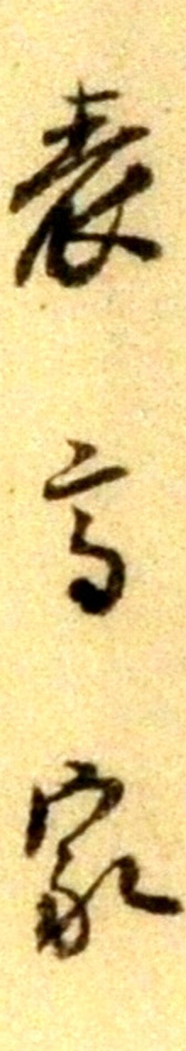表高家
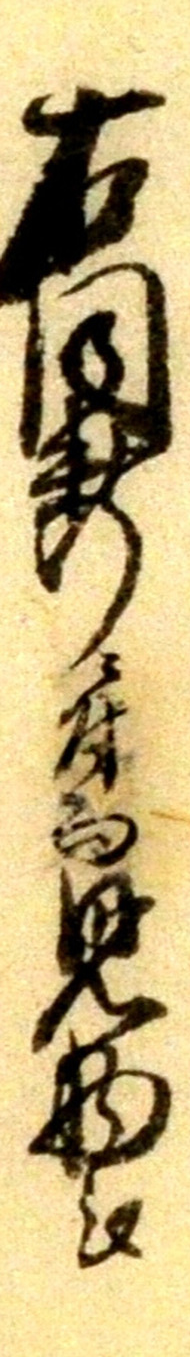右同断ニ付而見物被
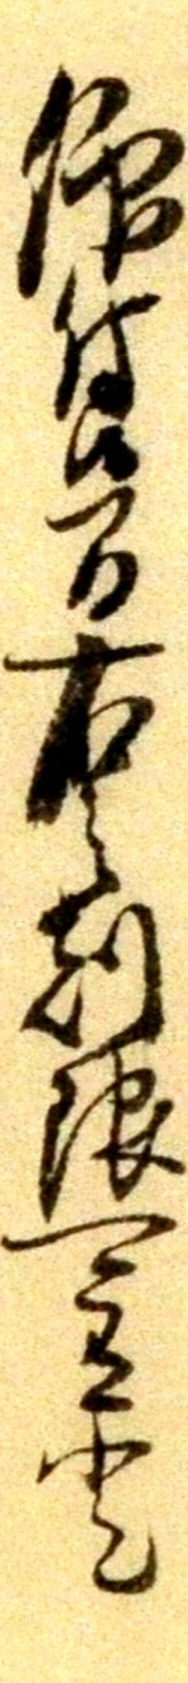仰付候間右之刻限可有登
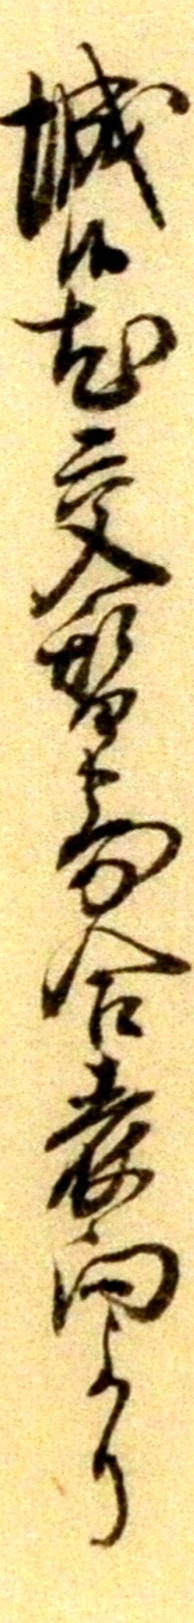城候尤交替寄合表向より
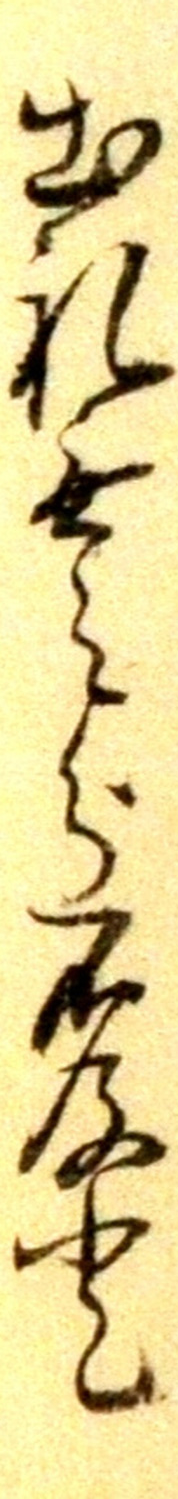出礼無之分不及登

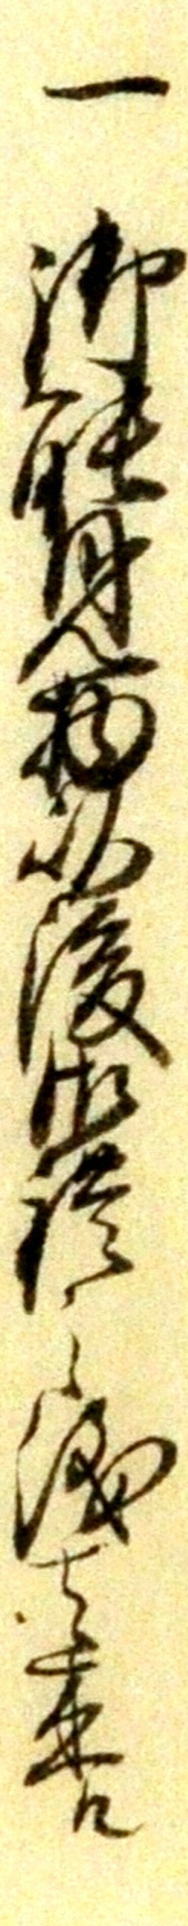一御能見物以後御礼之儀は来ル
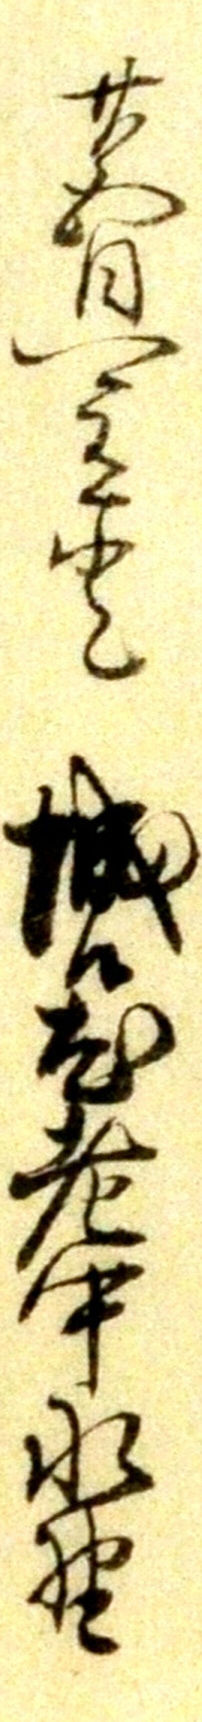廿五日可有登城候尤老中水野
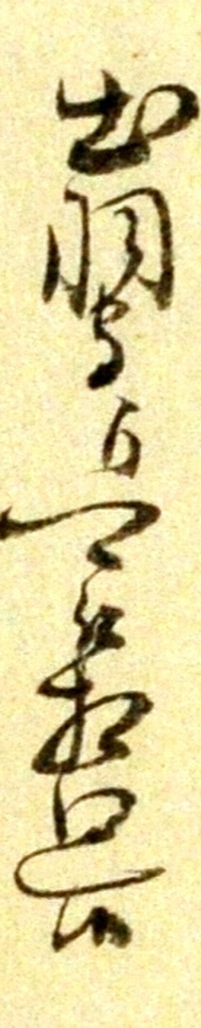出羽守え可被相廻候
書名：御移徒相済御祝儀御能ノ節ノ留外
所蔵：伊那市立高遠町図書館・合同会社AMANE
